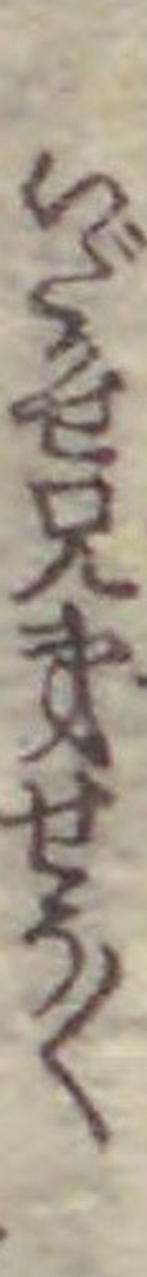いだかせ兄弟せう〳〵
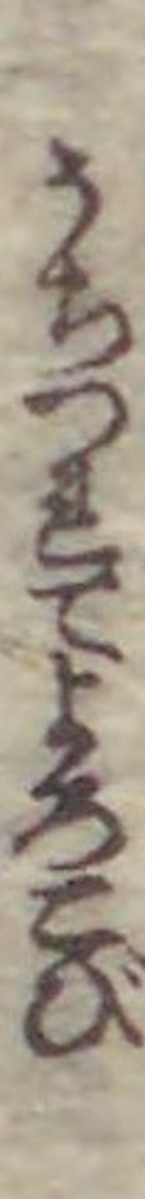うちつれてよろこび
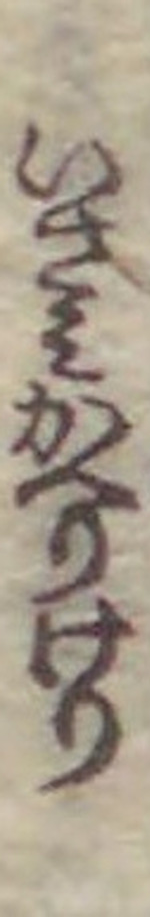いさみかへりけり

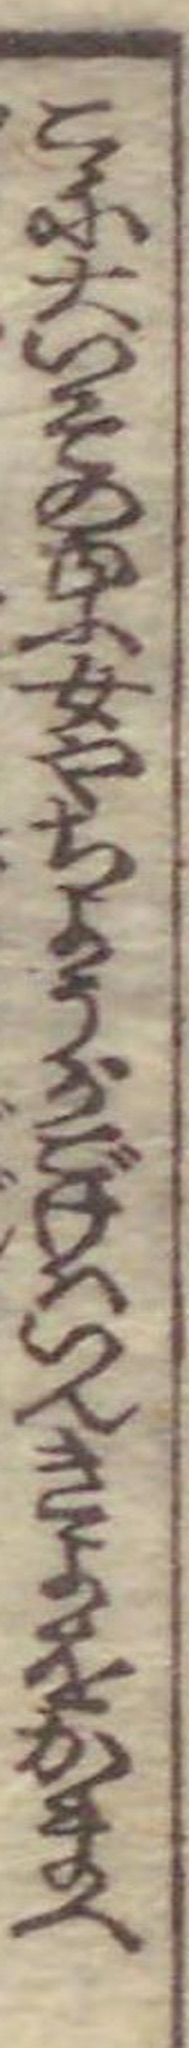こゝに大いそのゆふ女やちようがごけはいんきよをかまへ
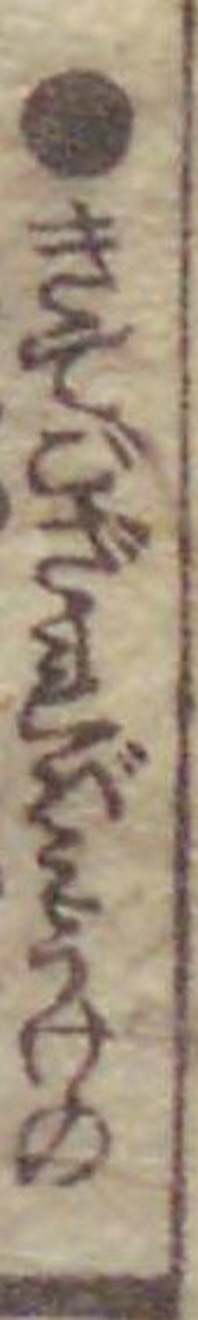●きてござればみうけの
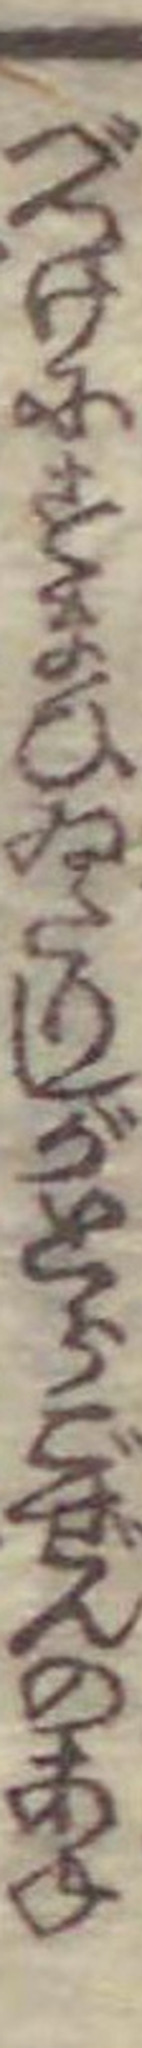べつけにすまひゐたりしがとらごぜんのあね
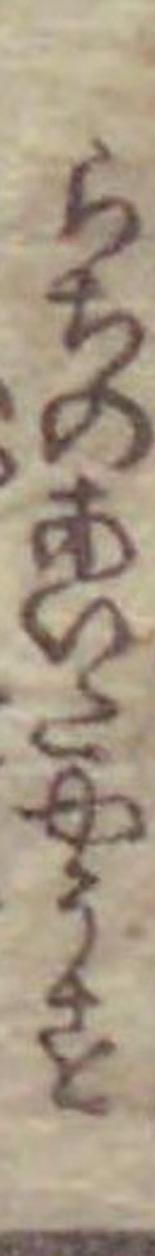らちのあいたやうす
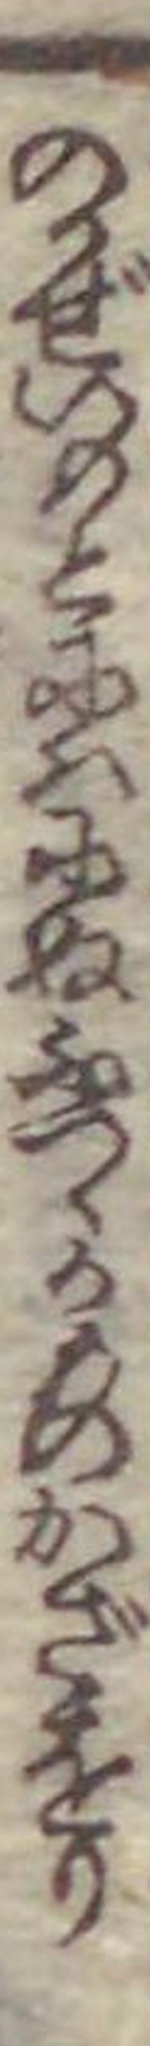のかぜいもとにはにぬふつゝかものかざをり
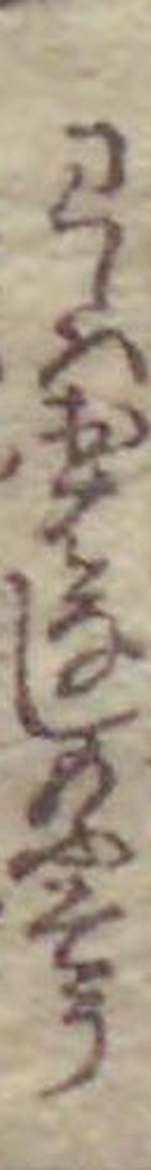わしはおはなしもふそう
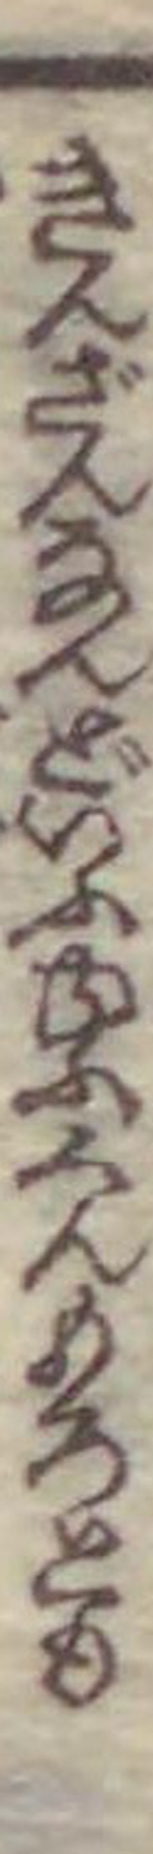きんざんなんどいふゆふくんもろとも
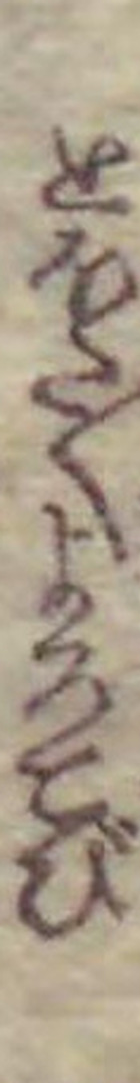とほた〳〵よろこび
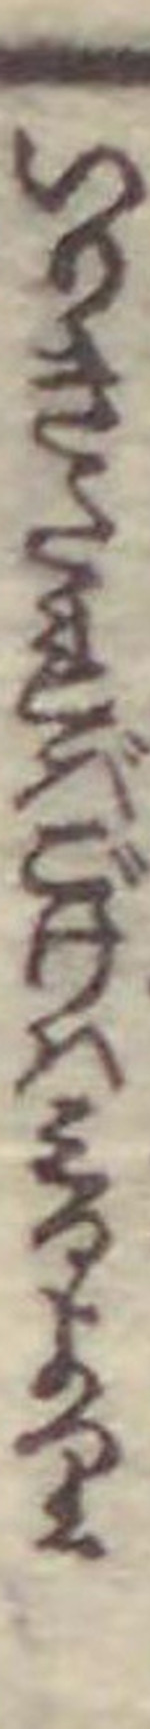いりきたればごけはみるより
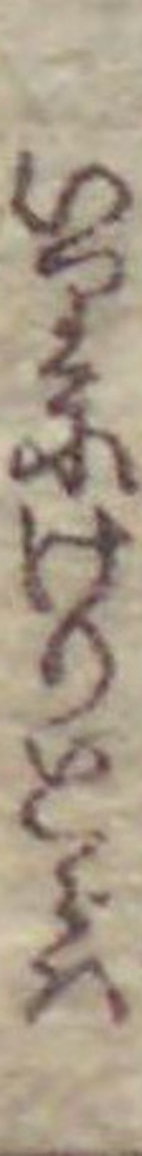いりにけりとらは
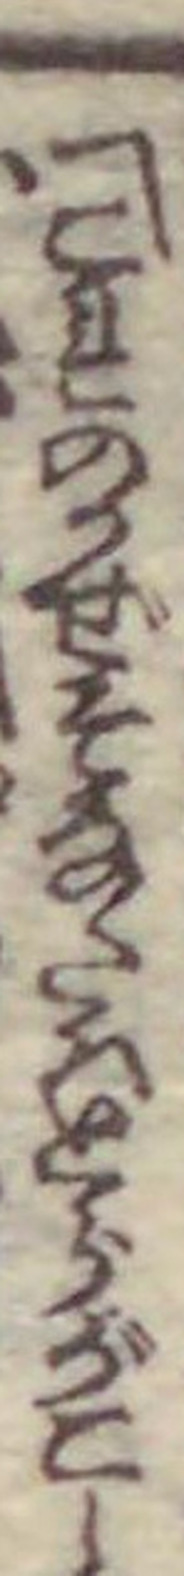〽これのかぜそなたはとらがこしを
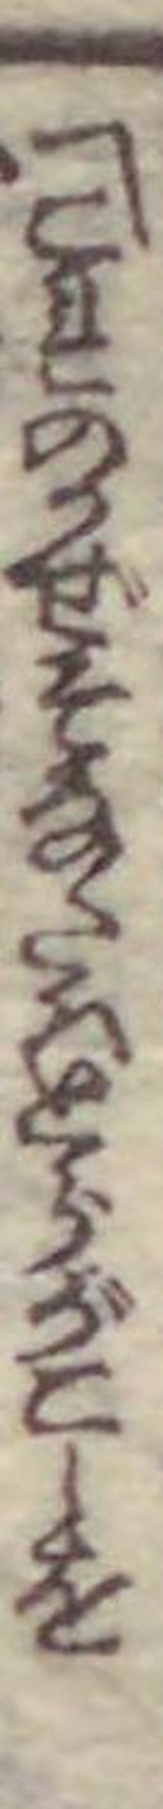〽これのかぜそなたはとらがこしを
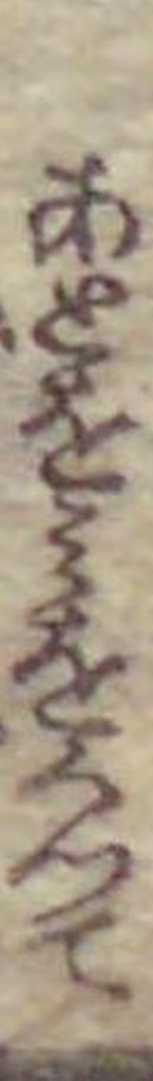あとをみをくつて
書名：大時代唐土化物 3巻. 曽我太夫染
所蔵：国立国会図書館 National Diet Library, JAPAN
